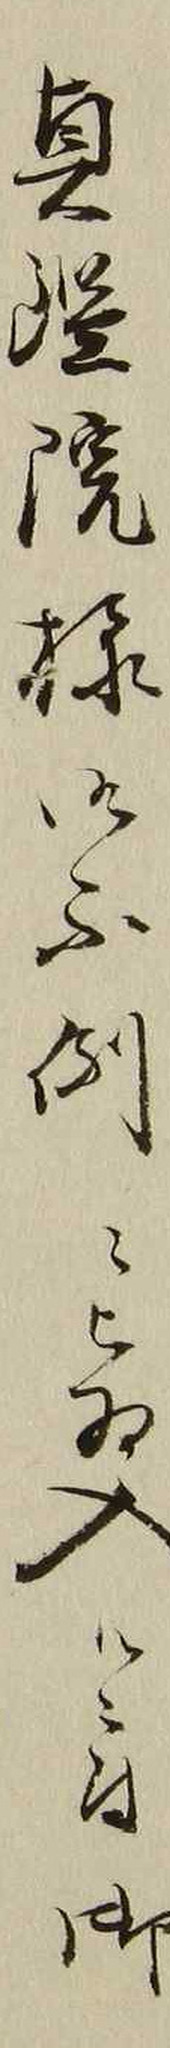貞鑑院様御不例に被為入候に付御
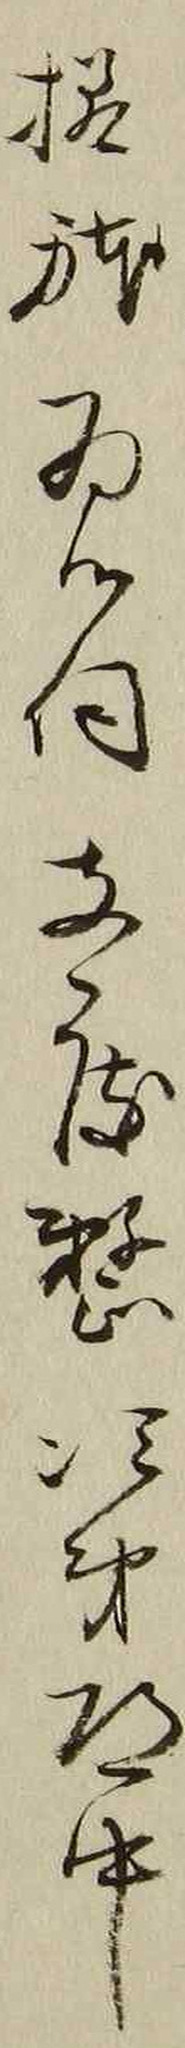様体為御伺支度整次第道中
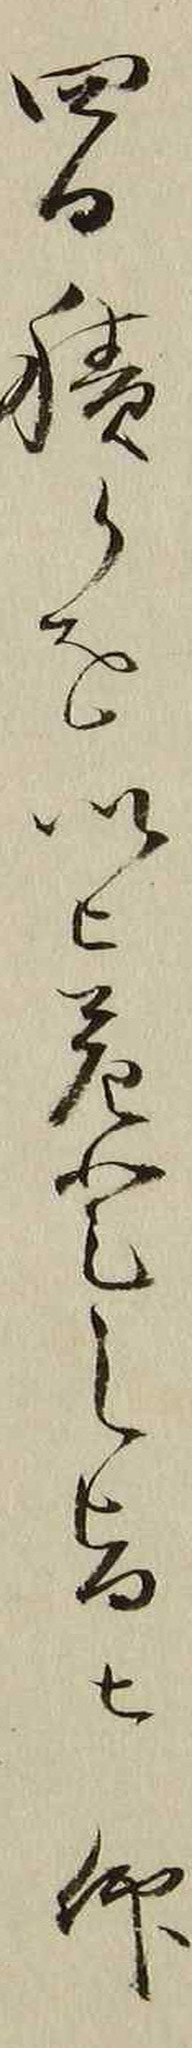四日積りを以被差登之旨被仰
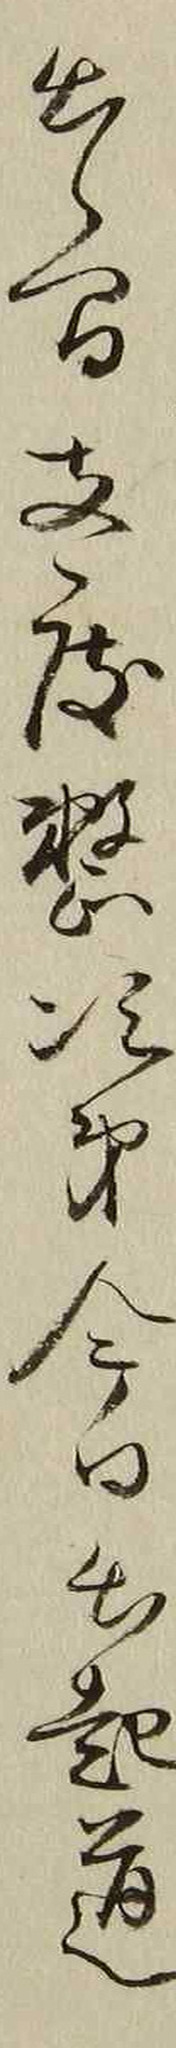出候間支度整次第今日出起道
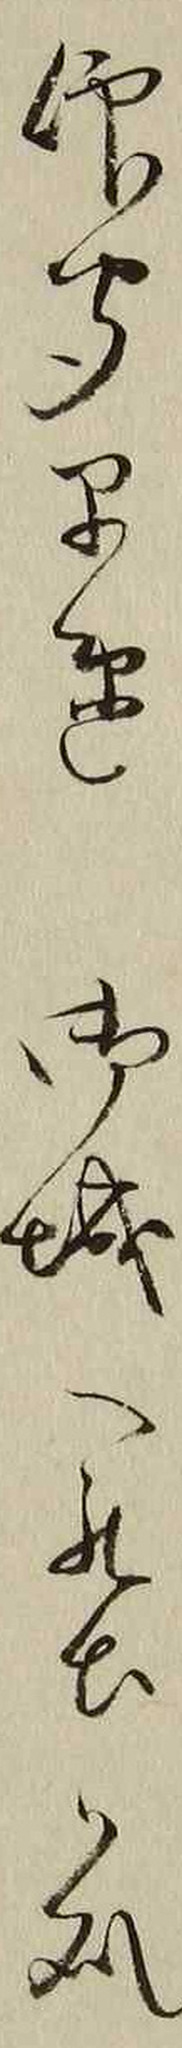仰聞早速御城へ罷出候処
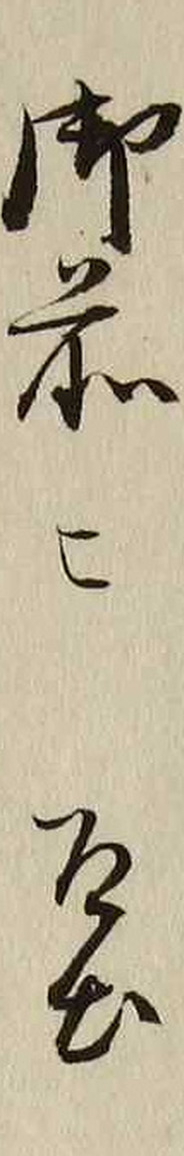御前被召出
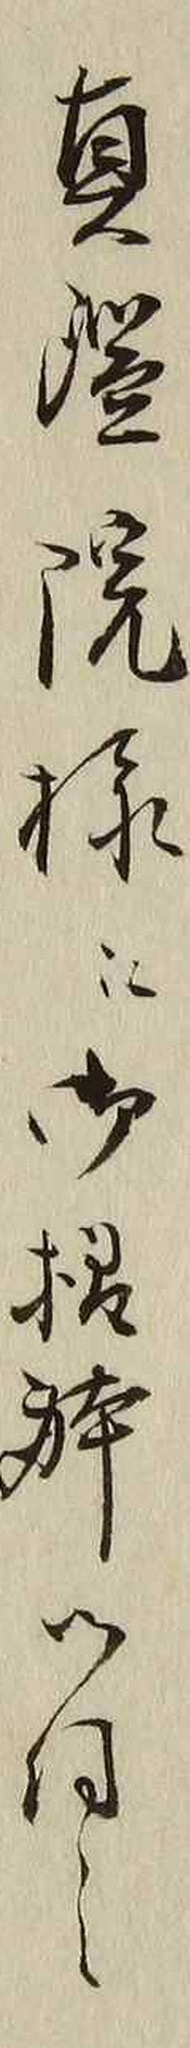貞鑑院様江御様体御伺之
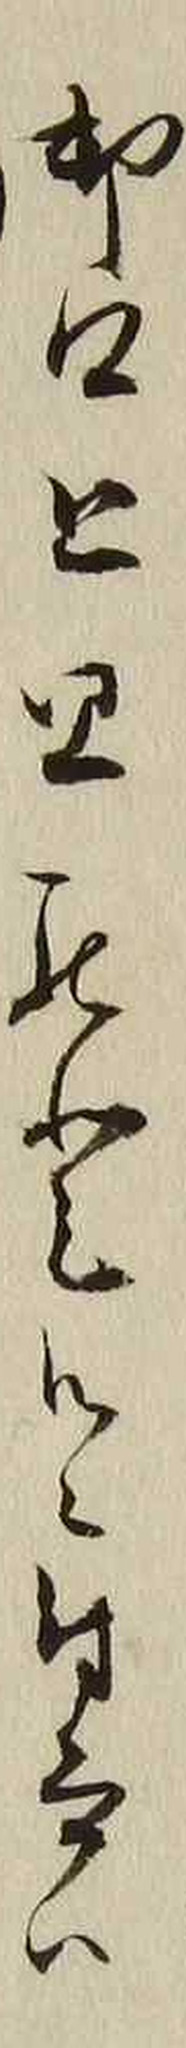御口上且罷登候に付而は
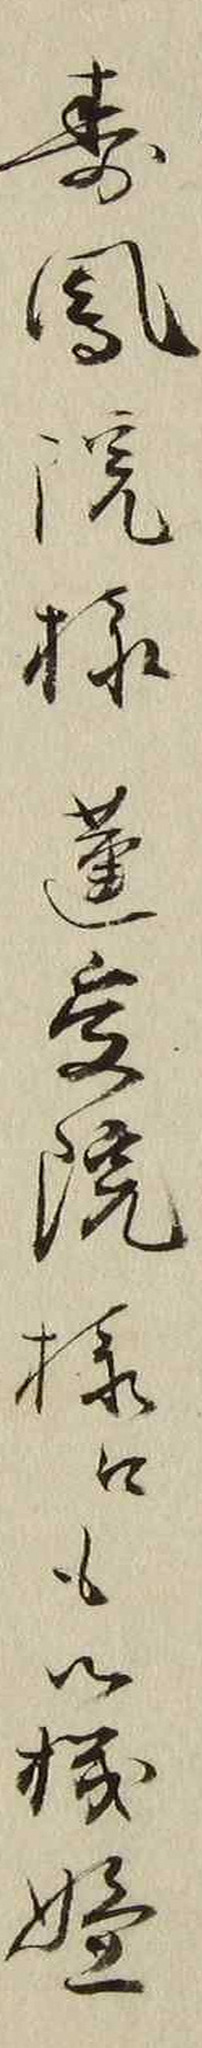寿鳳院様蓮受院様江も御機嫌
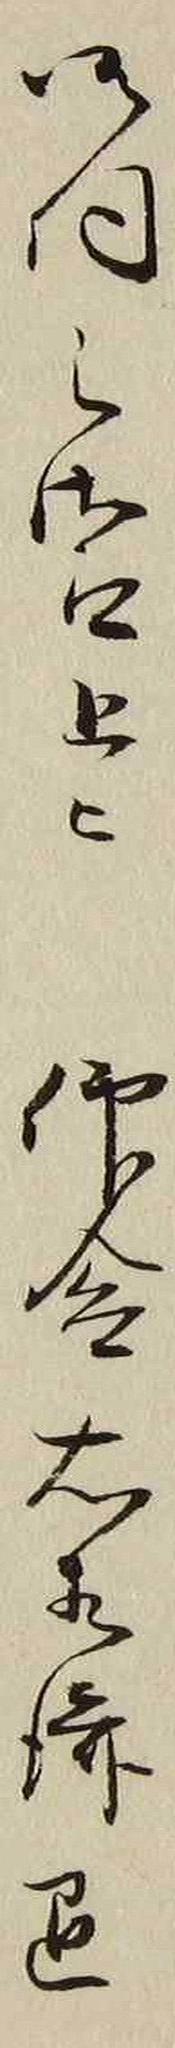御伺之御口上被仰令右相済退
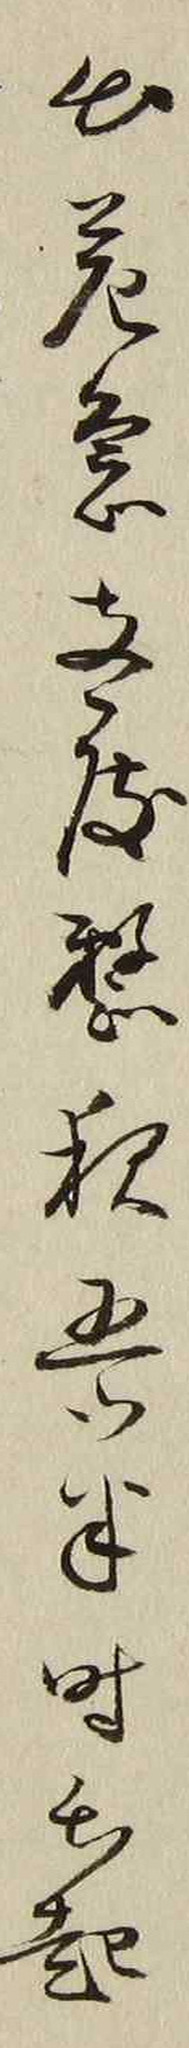出差急支度整夜五つ半時出起
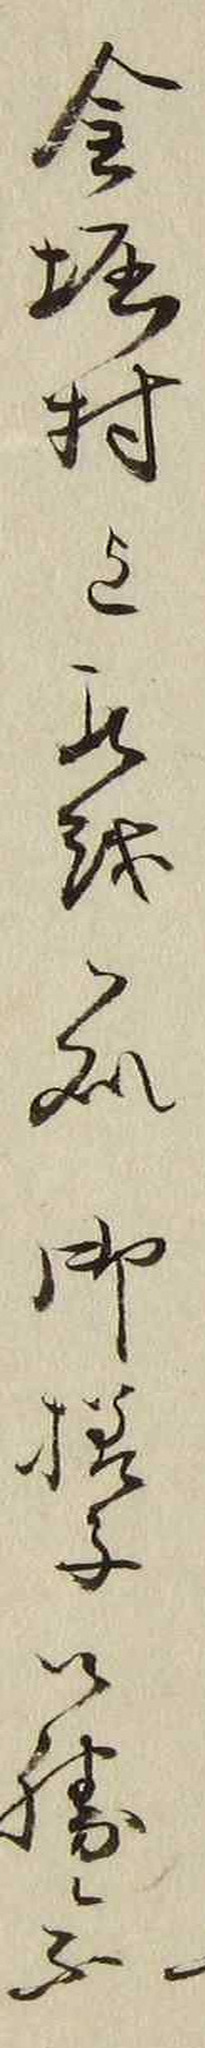金堀村迄罷越候処御様子御勝れ不
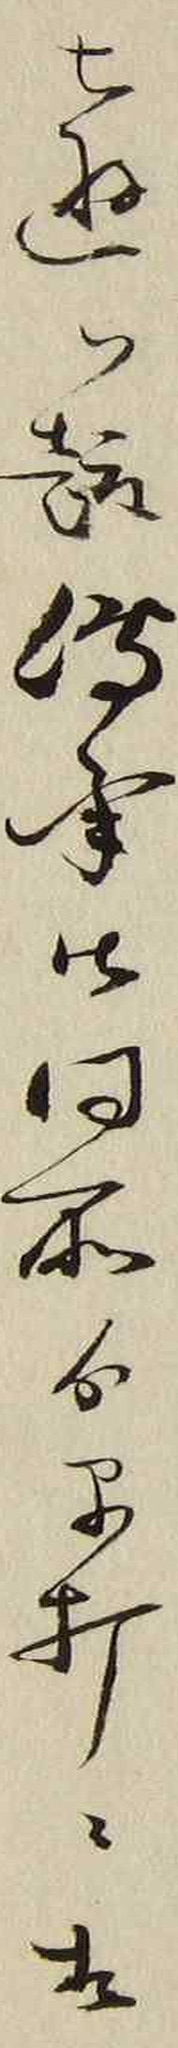被遊候趣伝聞御同所ゟ早打に相
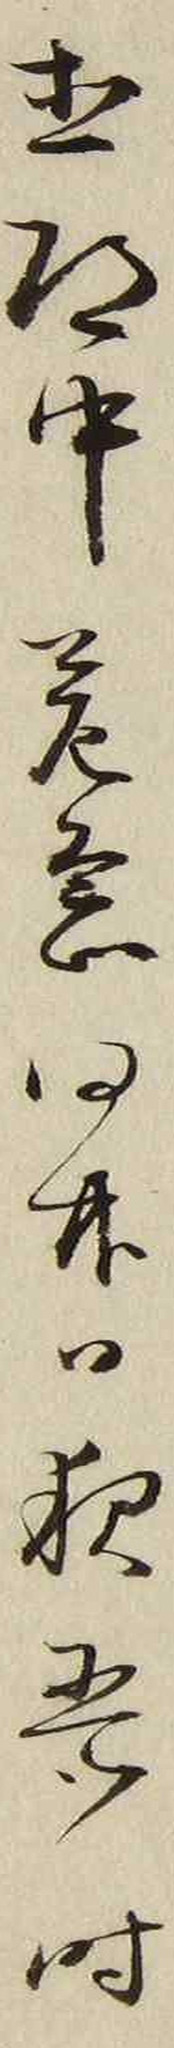直道中差急同廿日夜五つ時
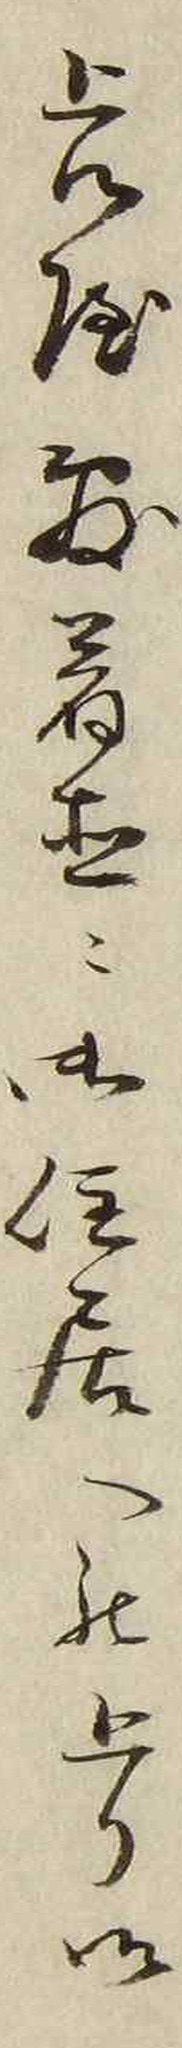上御屋敷着直に御住居へ罷上り御

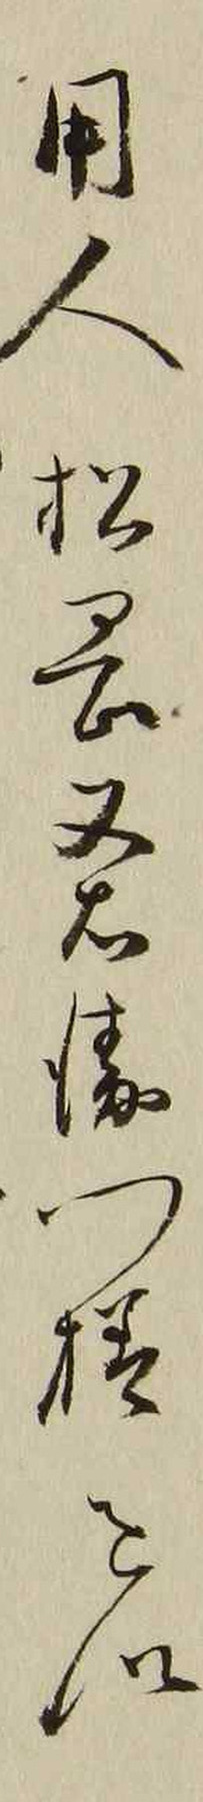用人松岡又右衛門様を以
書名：諸士系譜　巻之292　き之部1
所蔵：会津若松市立会津図書館
